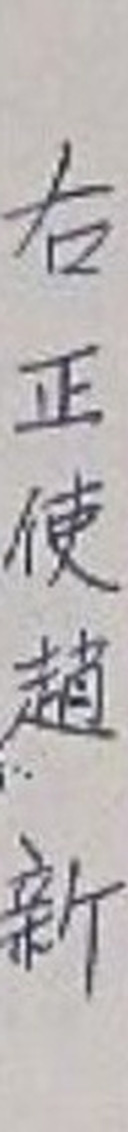右正使趙新
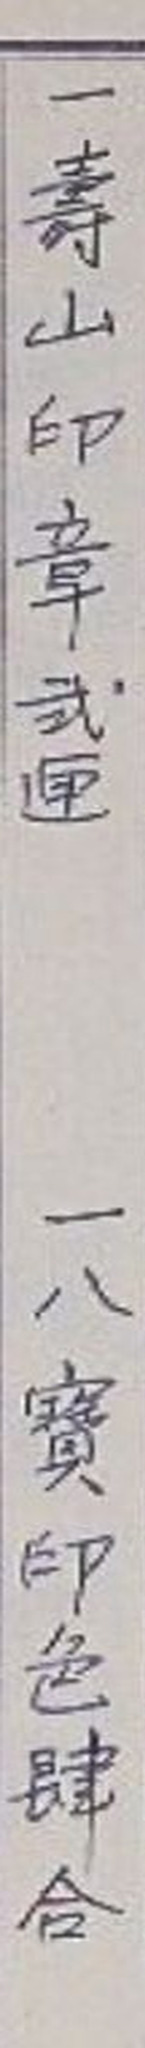一寿山印章弐匣一八宝印色肆合
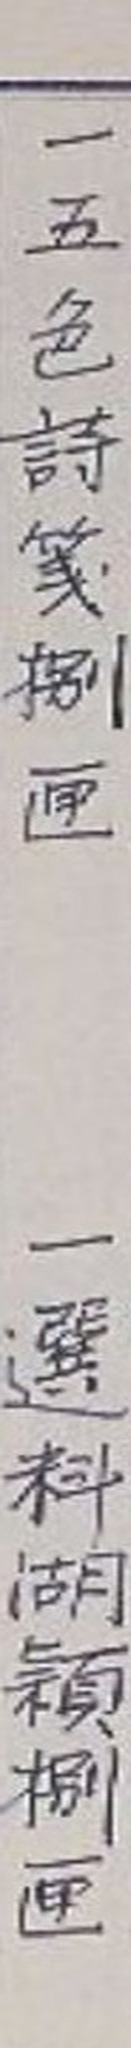一五色詩箋捌匣一選料湖頴捌匣
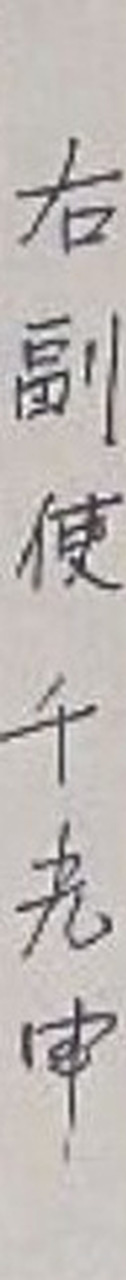右副使千光申
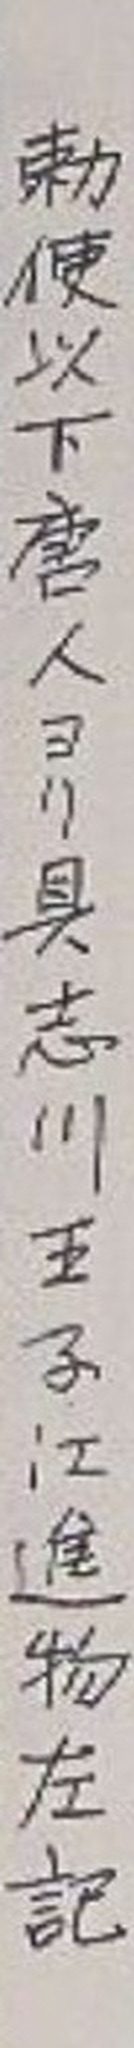勅使以下唐人より具志川王子え進物左記
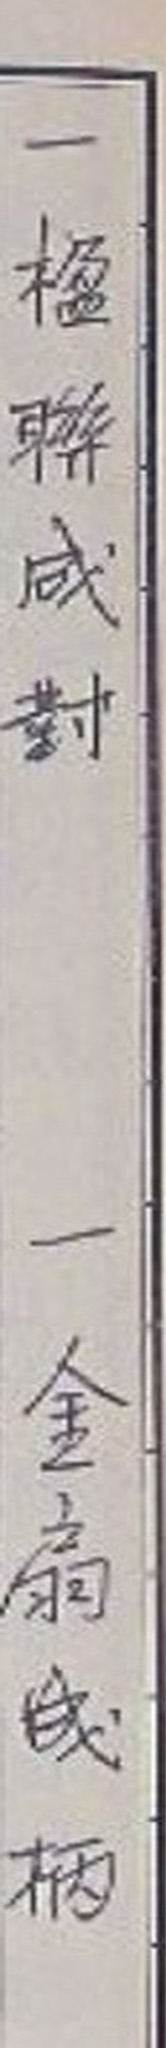一楹聯成対一金扇成柄
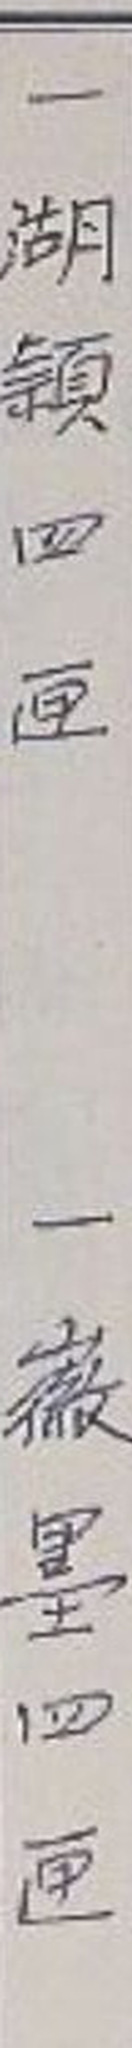一湖頴四匣一徽墨四匣
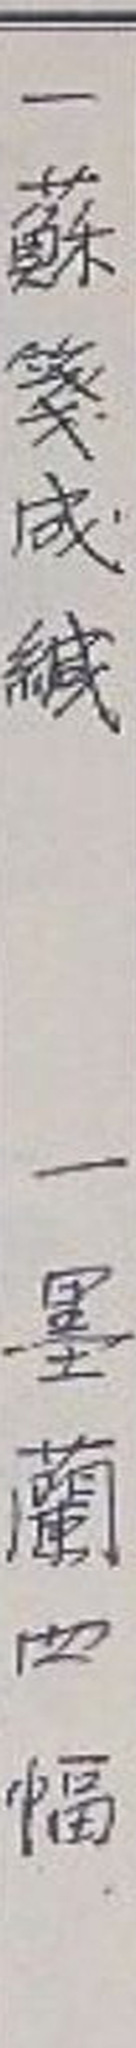一蘇箋成緘一墨蘭四幅
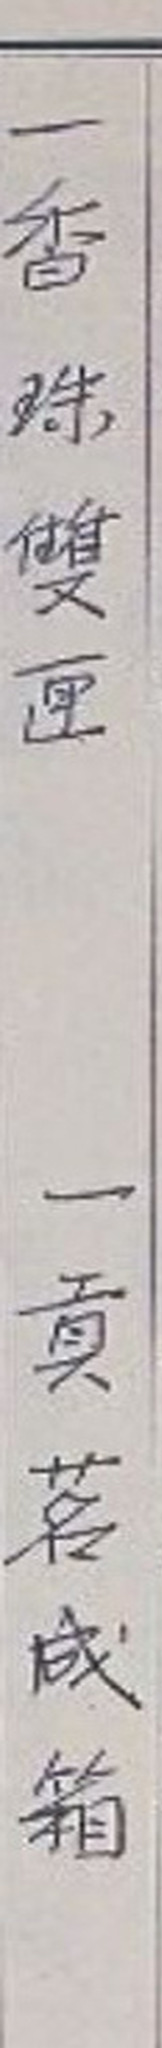一香珠雙匣一貢茗成箱
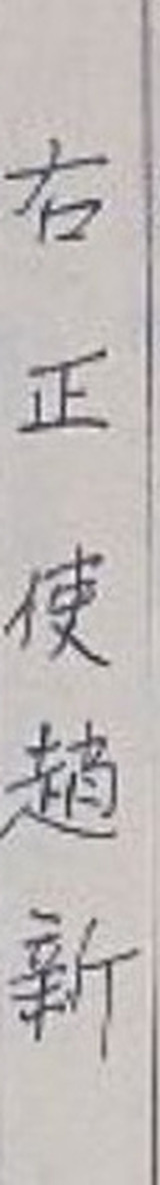右正使趙新
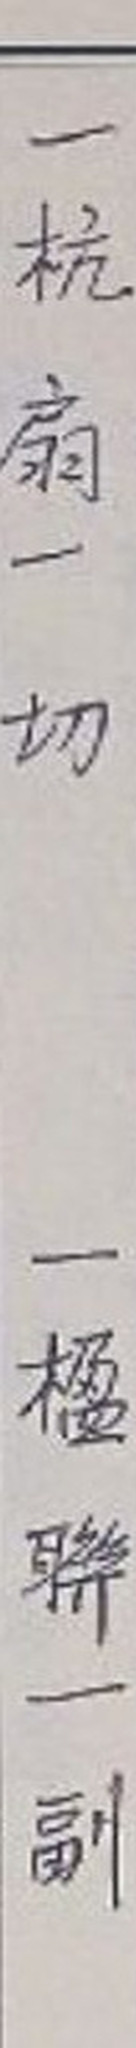一杭扇一切一楹聯一副
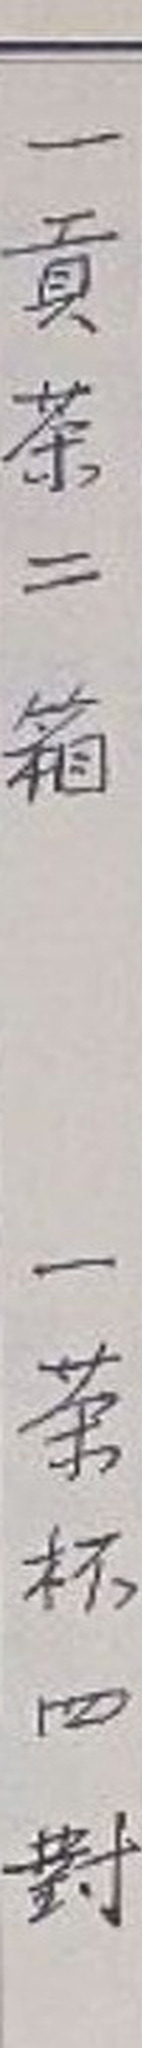一貢茶二箱一茶杯四対
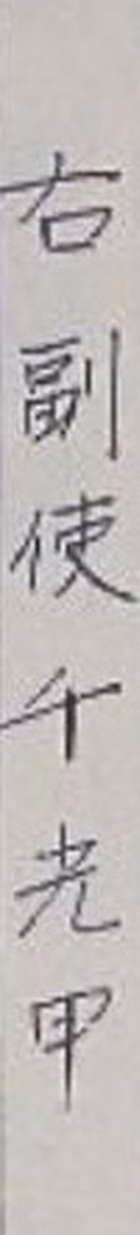右副使千光申
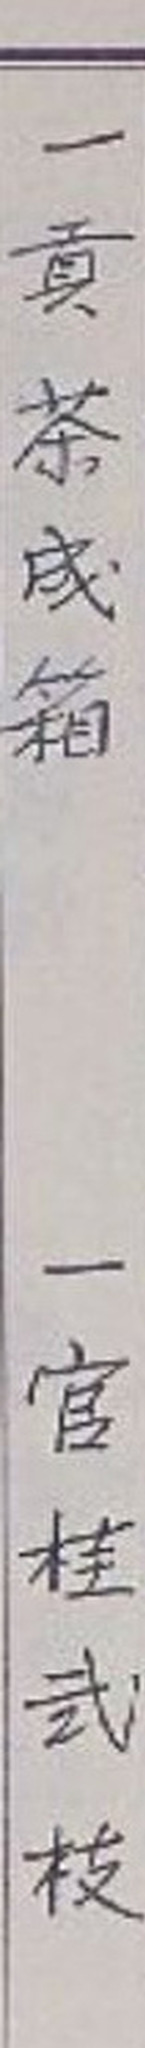一貢茶成箱一宮桂弐枝
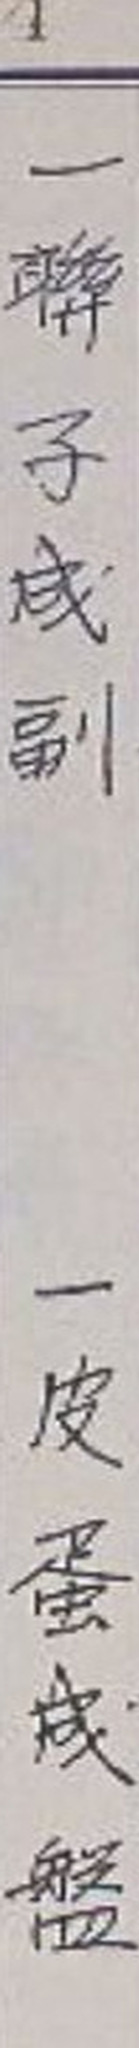一聯子成副一皮蛋成盤
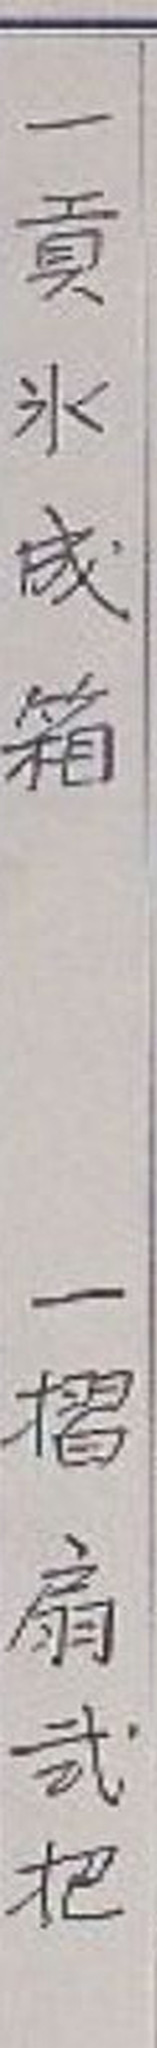一貢氷成箱一摺扇弐把
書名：支那冊封使来琉諸記 下巻
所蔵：University of the Ryukyus Library
